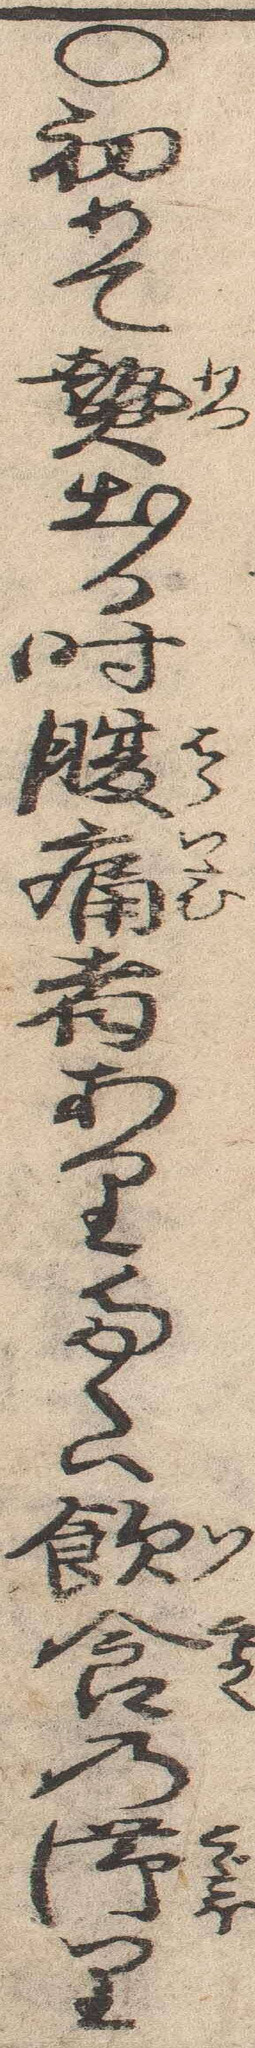○初めて熱出る時腹痛者あり多くは飲食の滞り

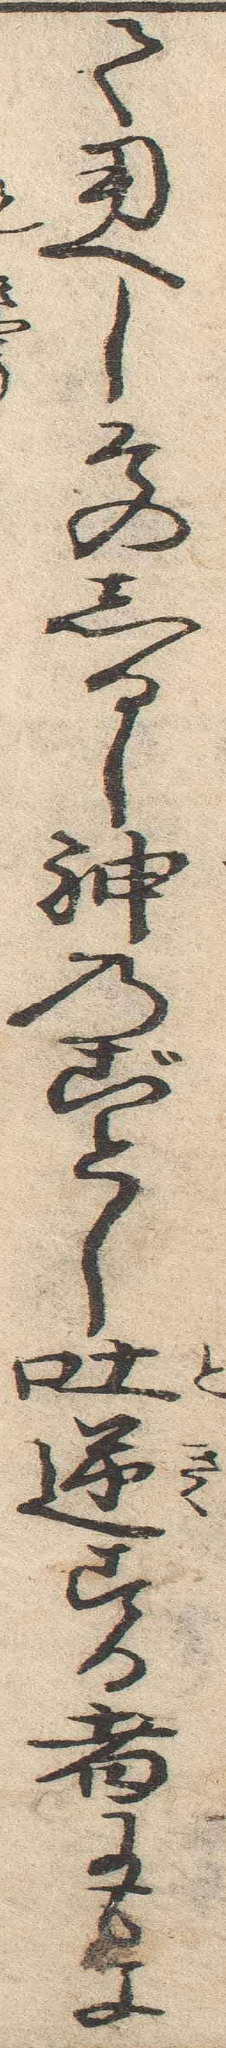て用へしそのしるし神のごとし吐逆する者にもよ
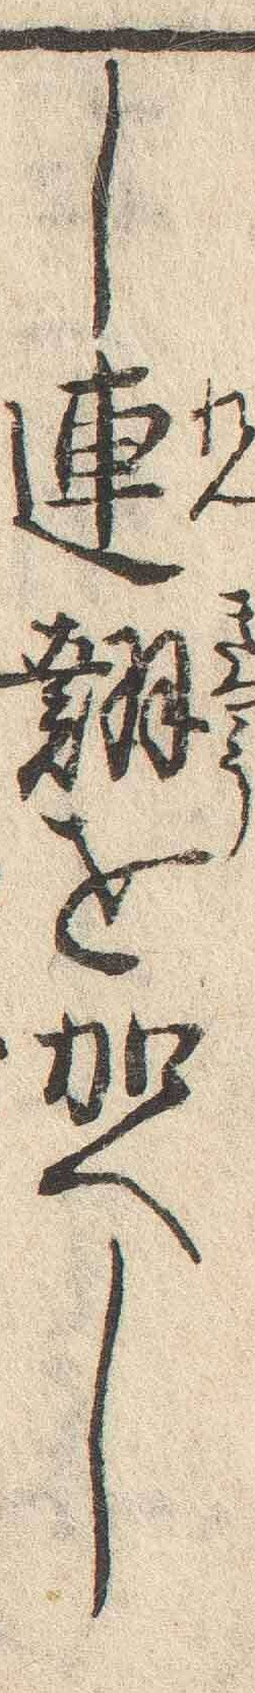し連翹を加へし
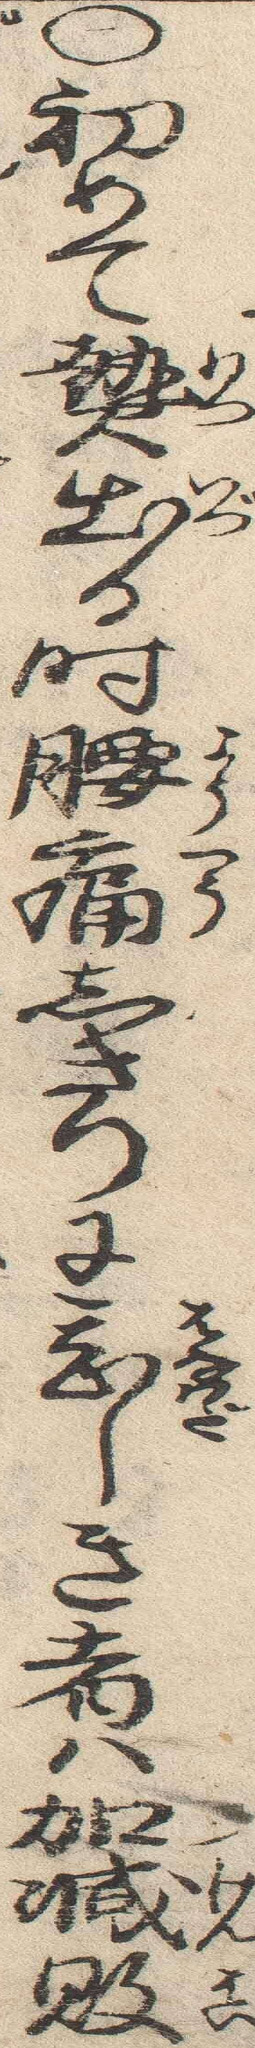○初めて熱出る時腰痛しきりに甚しき者は加減敗
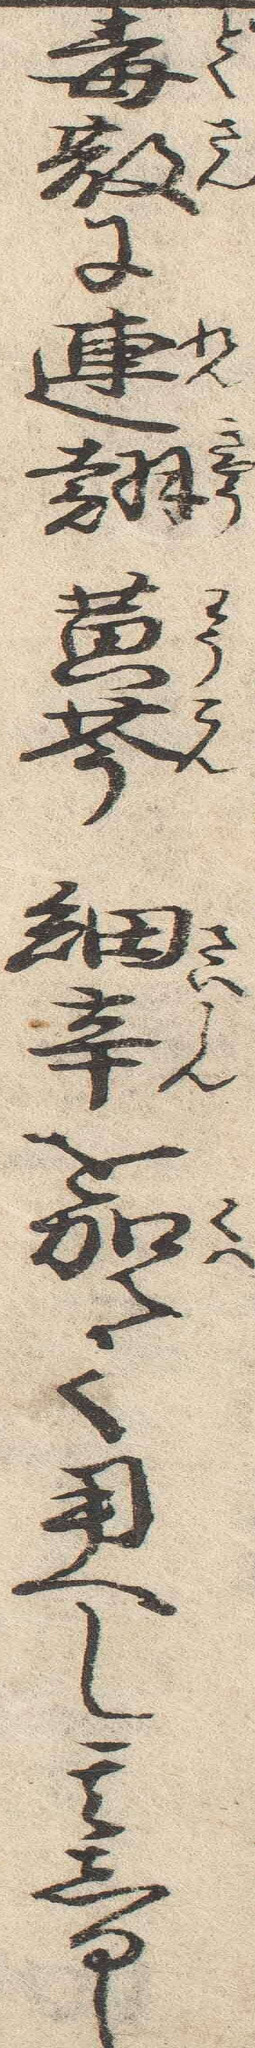毒散に連翹黄芩細辛を加えて用へし其しるし
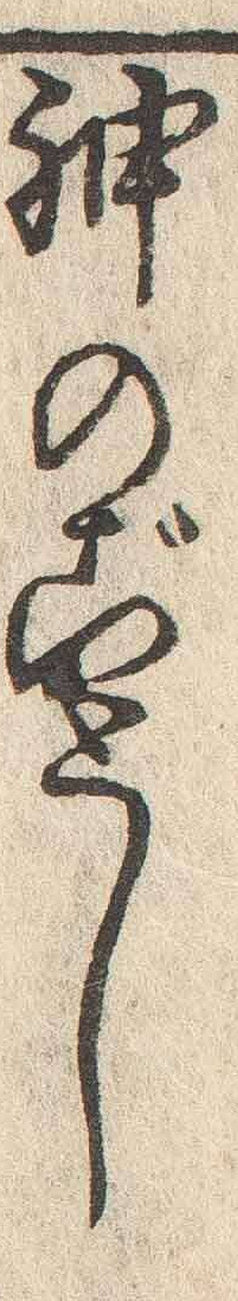神のごとし
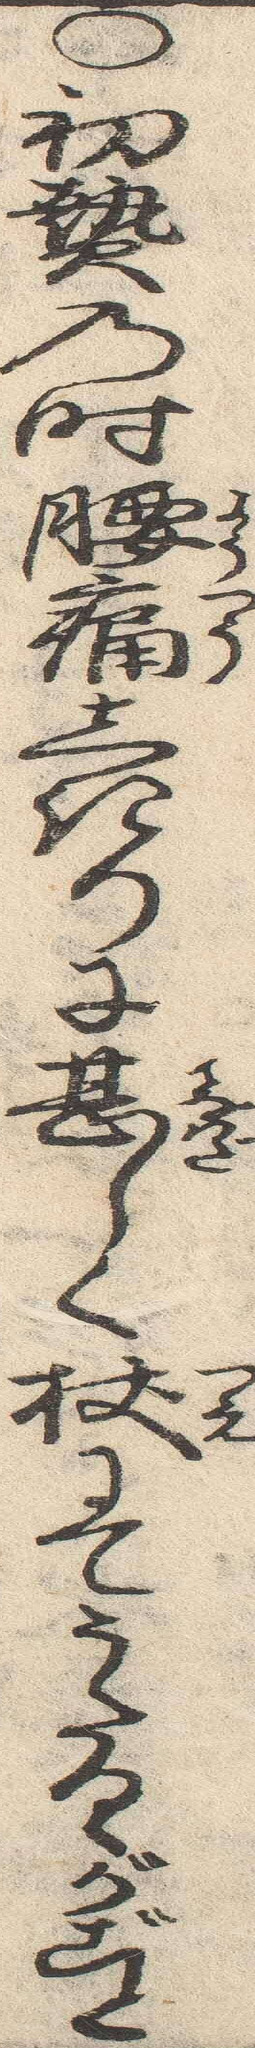○初熱の時腰痛しきりに甚しく杖にてうたるゝがごと
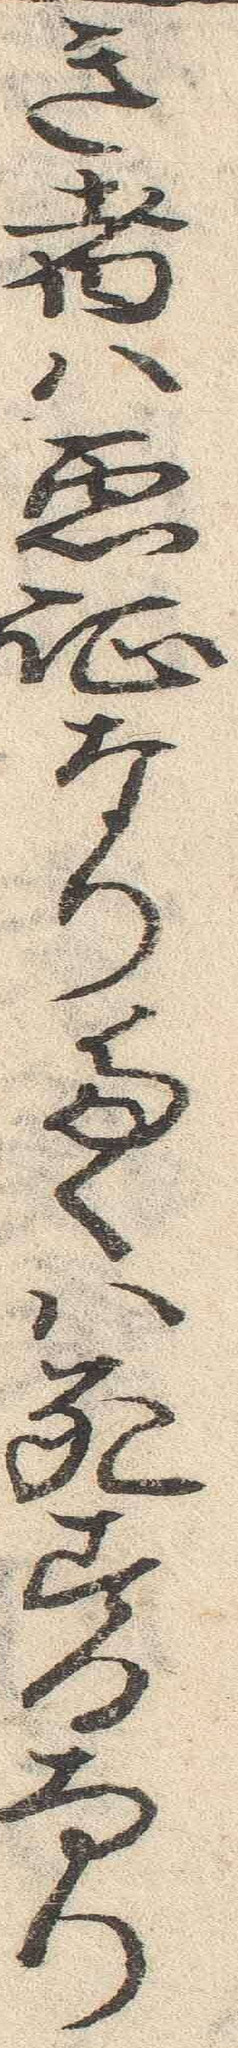き者は悪証なり多くは死するなり
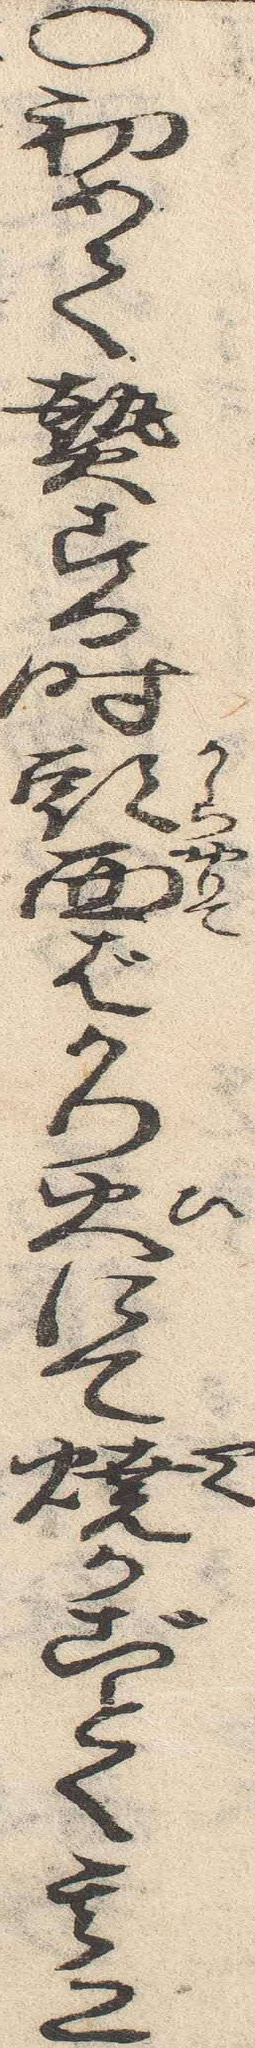○初めて熱する時頭面ばかり火にて焼かごとく其上
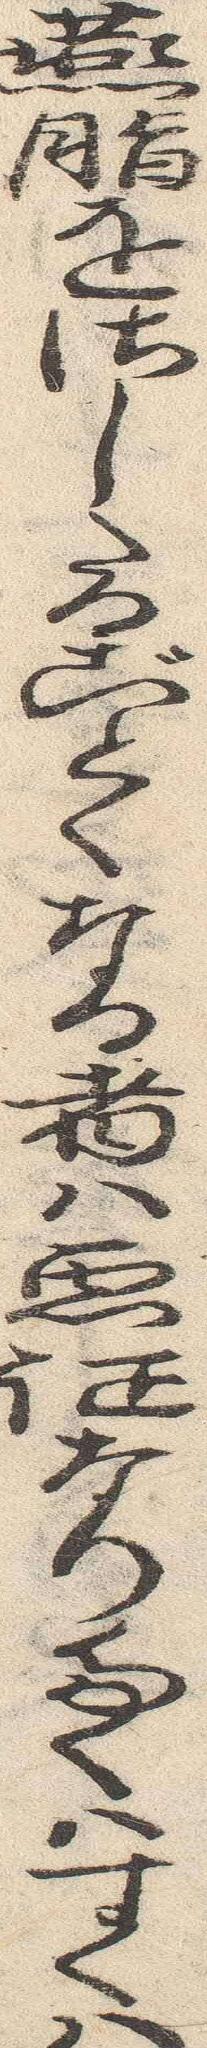燕脂をさしたるごとくなる者は悪証なり多くはすくは
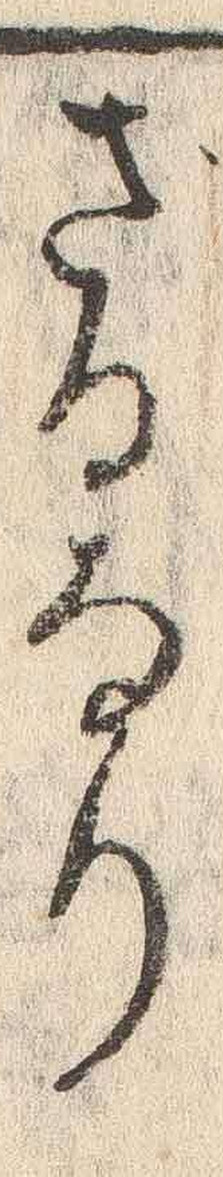さるなり
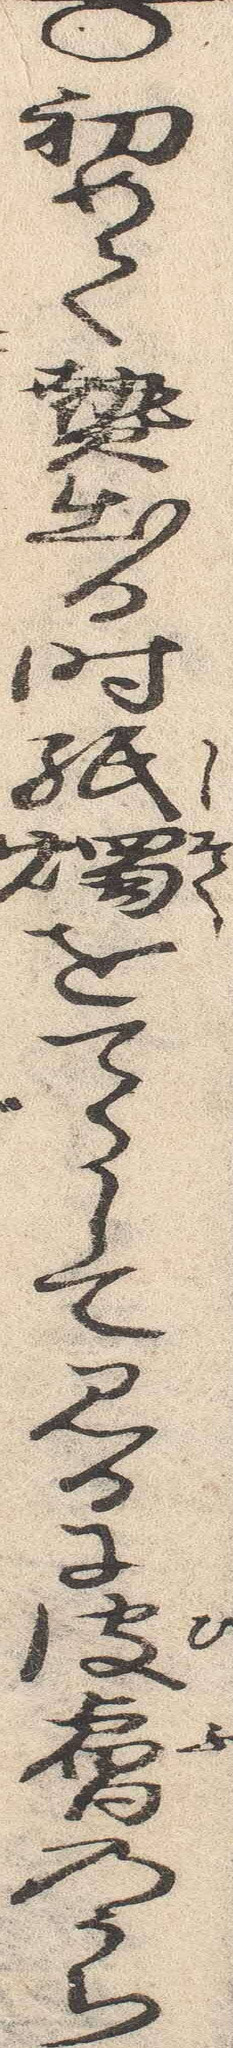○初めて熱出る時紙燭をてらして見るに皮膚のうち
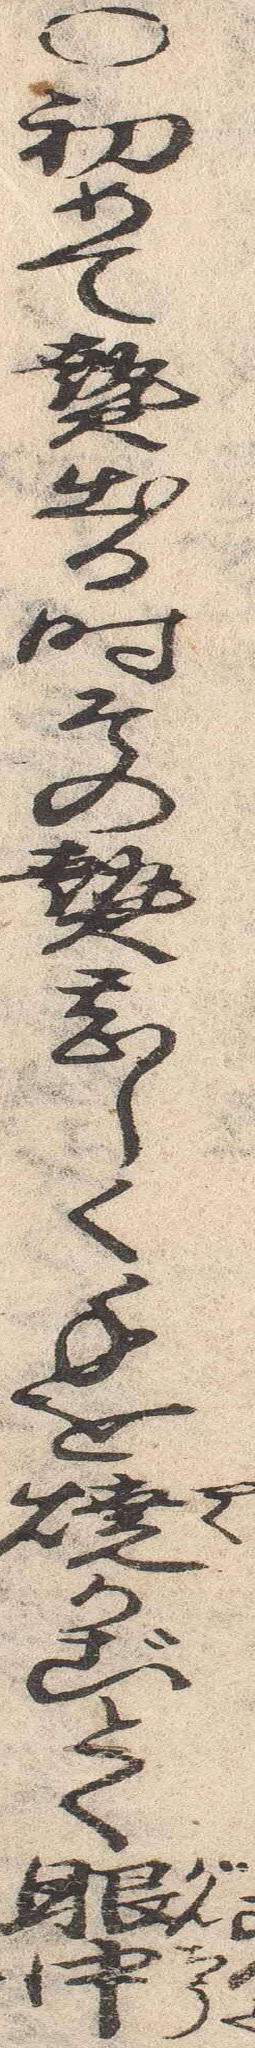○初めて熱出る時その熱甚しく手を焼かごとく眼中
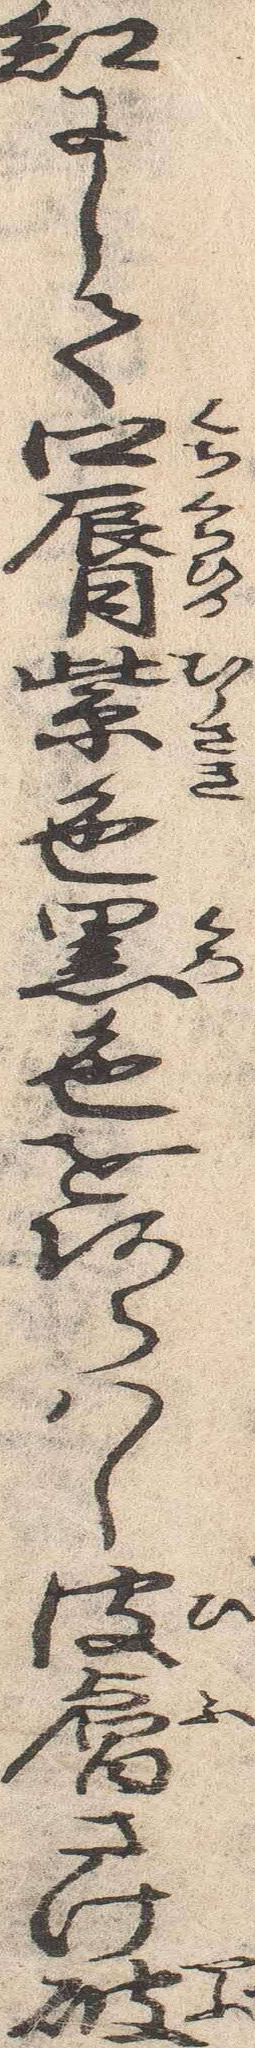紅にして口唇紫色黒色をあらはし皮膚さけ破
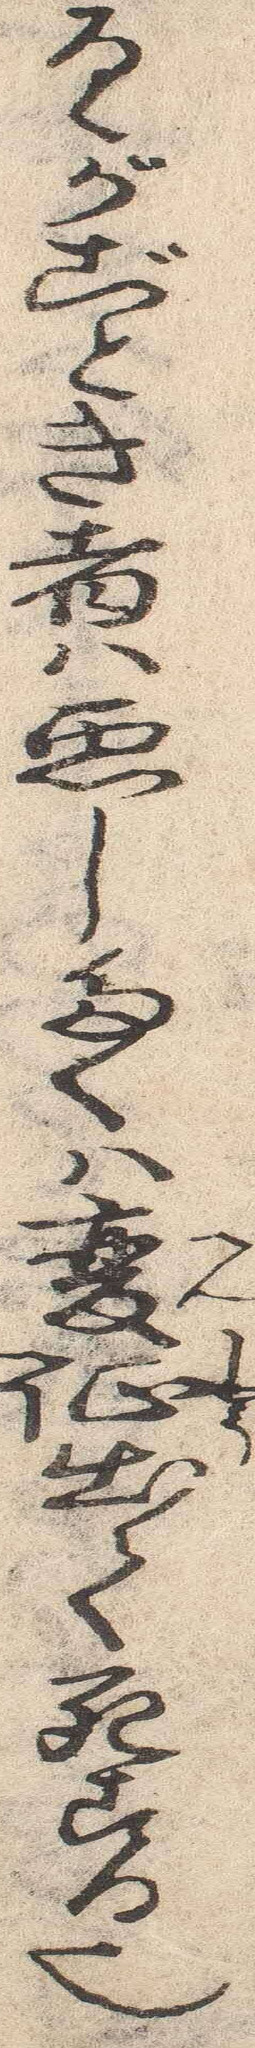るゝがごとき者は悪し多くは変証出て死する也
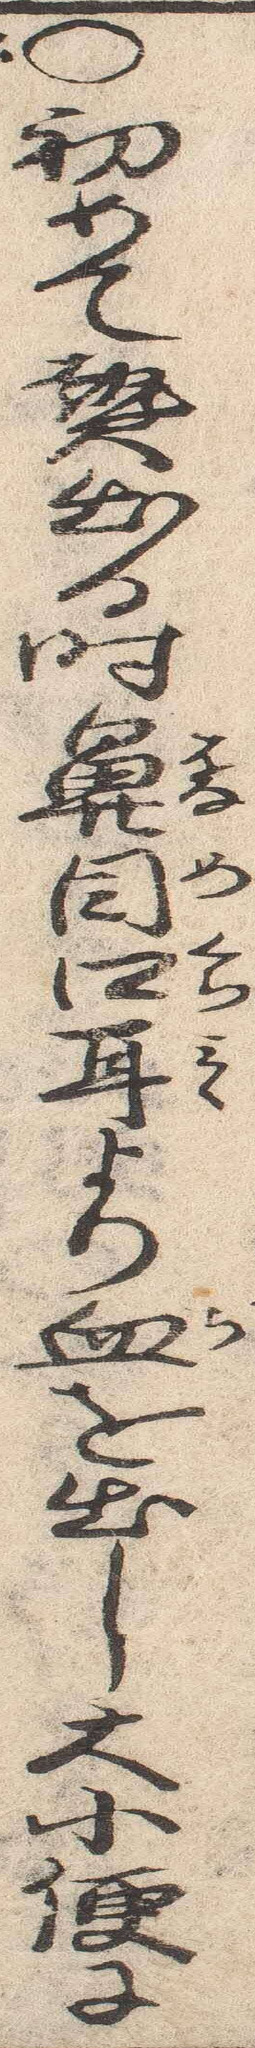○初めて熱出る時鼻目口耳より血を出し大小便に
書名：小児必用養育草
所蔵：東京学芸大学附属図書館 国文学研究資料館
